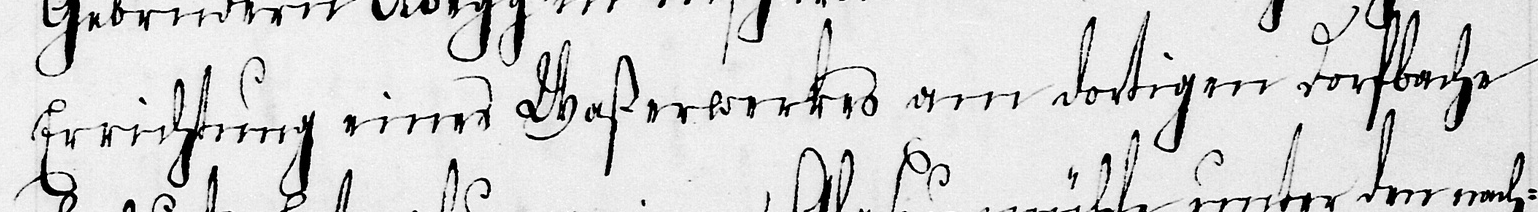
Errichtung eines Waßerwerkes am dortigen Dorfbache
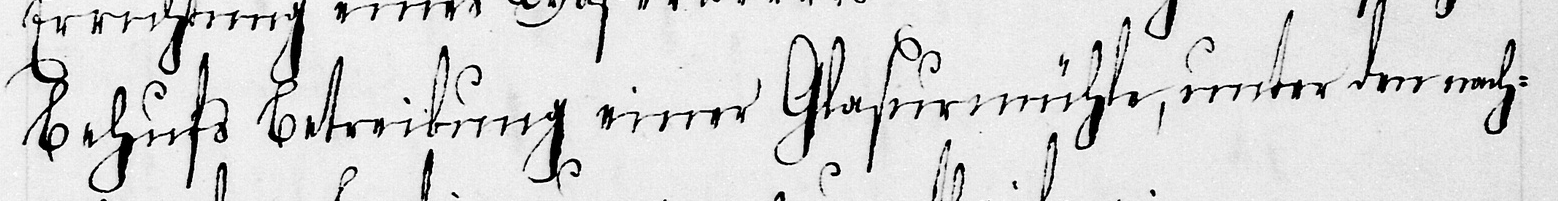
behufs Betreibung einer Glasurmühle, unter den nach¬
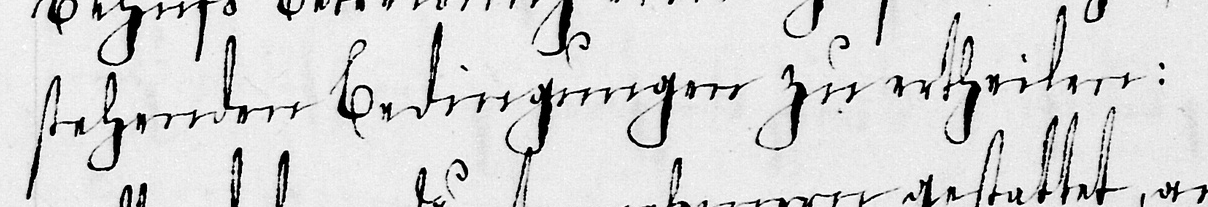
stehenden Bedingungen zu ertheilen:
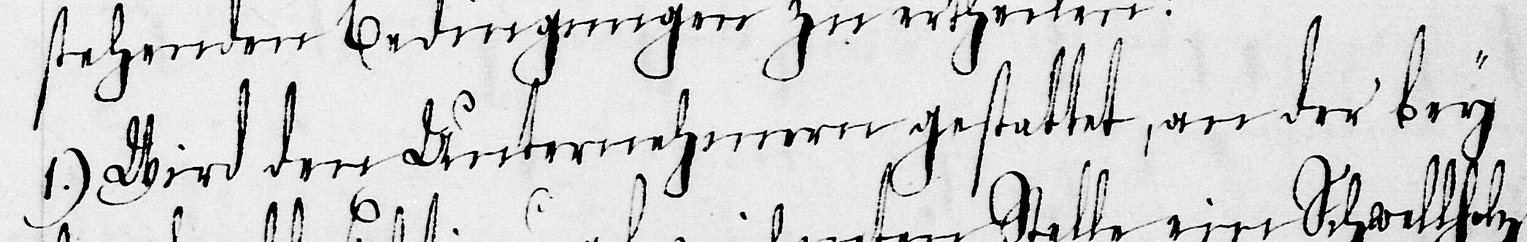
1.) Wird den Unternehmern gestattet, an der bey
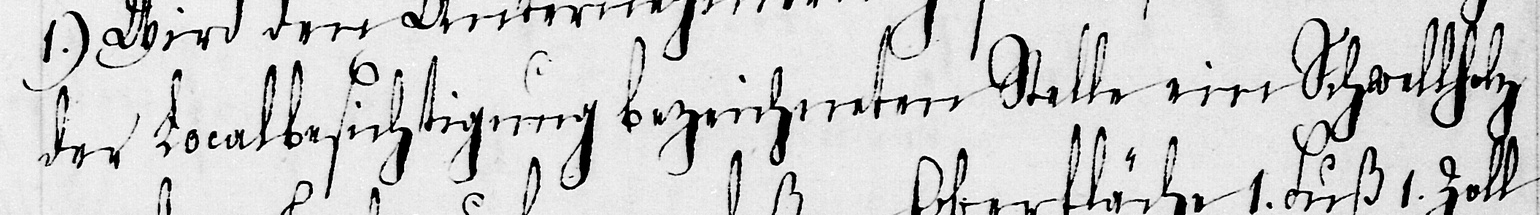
der Localbesichtigung bezeichneten Stelle ein Schwellholz
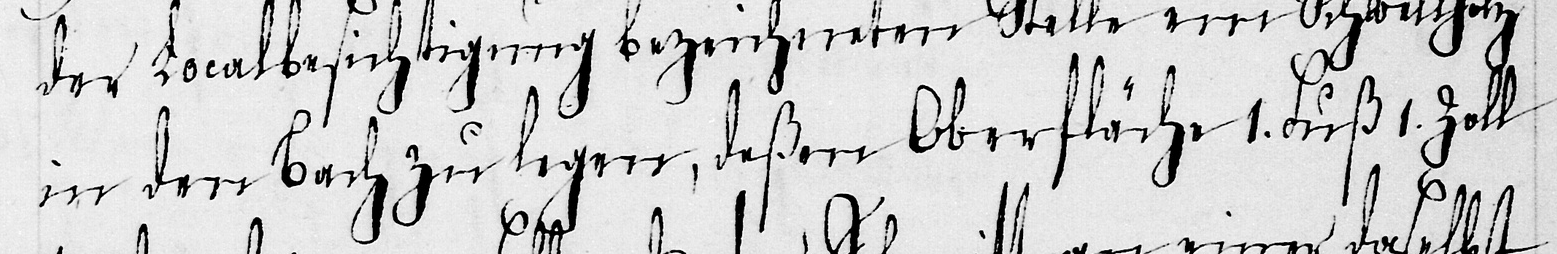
in den Bach zu legen, deßen Oberfläche 1. Fuß 1. Zoll
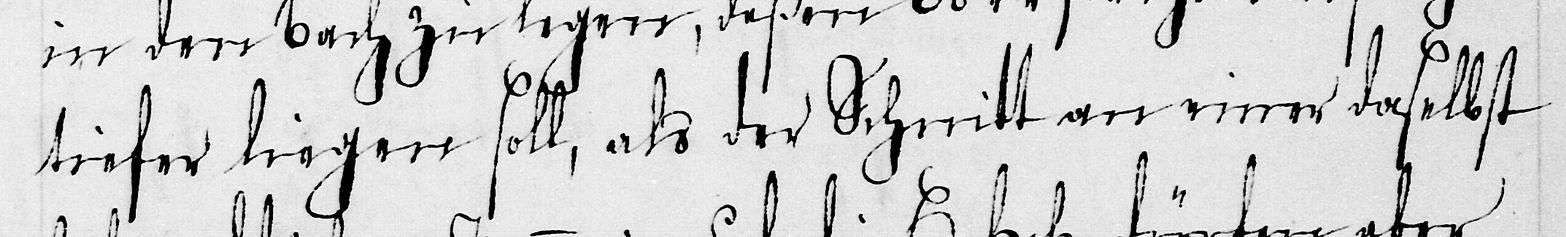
tiefer liegen soll, als der Schnitt an einer daselbst
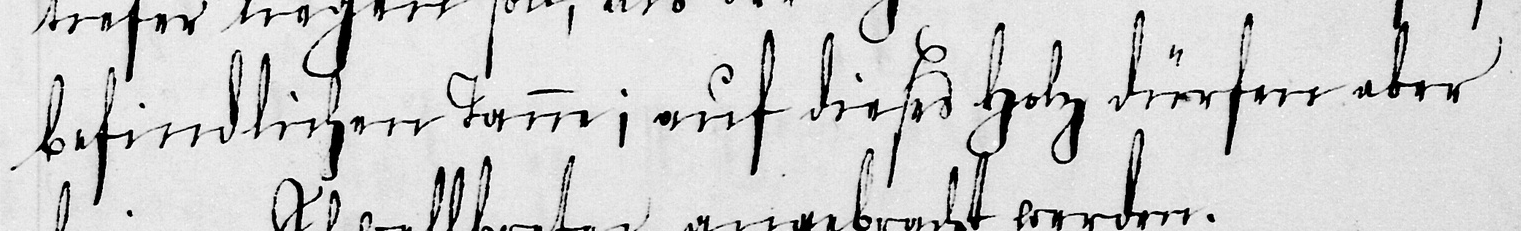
befindlichen Tanne; auf dieses Holz dürfen aber
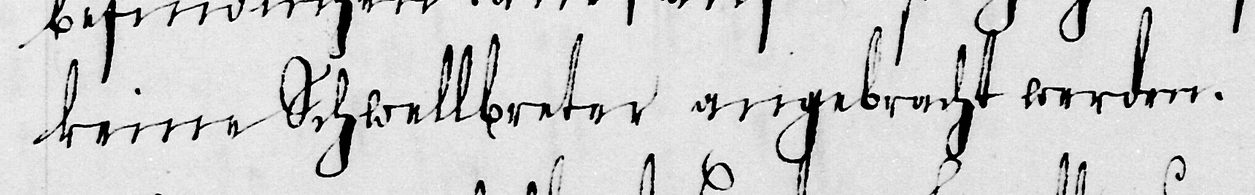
keine Schwellbreter angebracht werden.
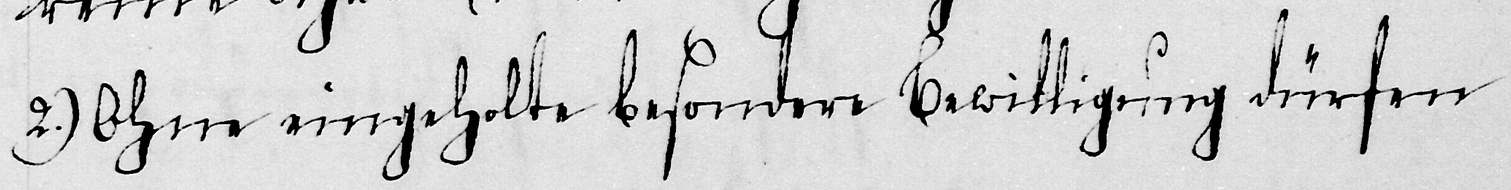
2.) Ohne eingeholte besondere Bewilligung dürfen
